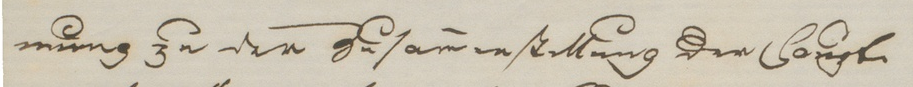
mung zu der Zusammenstellung der Haupt-
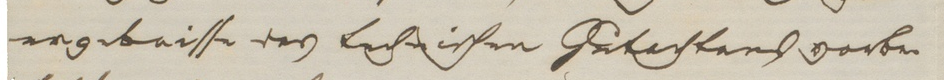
ergebnisse des technischen Gutachtens vorbe-
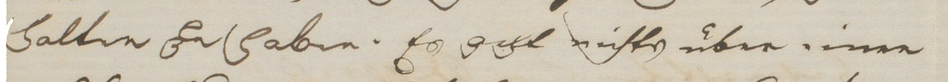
halten zu haben. Es geht nichts über einen
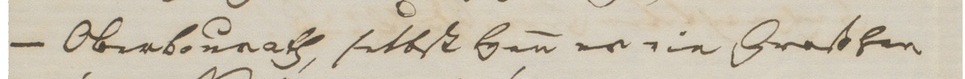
– Oberbaurath, selbst wenn es ein Großher-
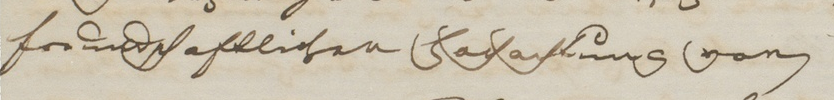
freundschaftlicher Hochachtung von
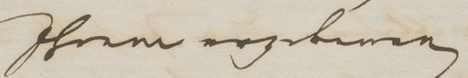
Ihrem ergebenen
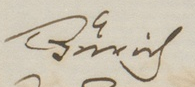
Zürich
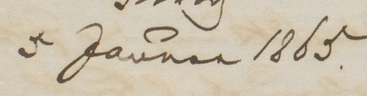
5 Januar 1865.
